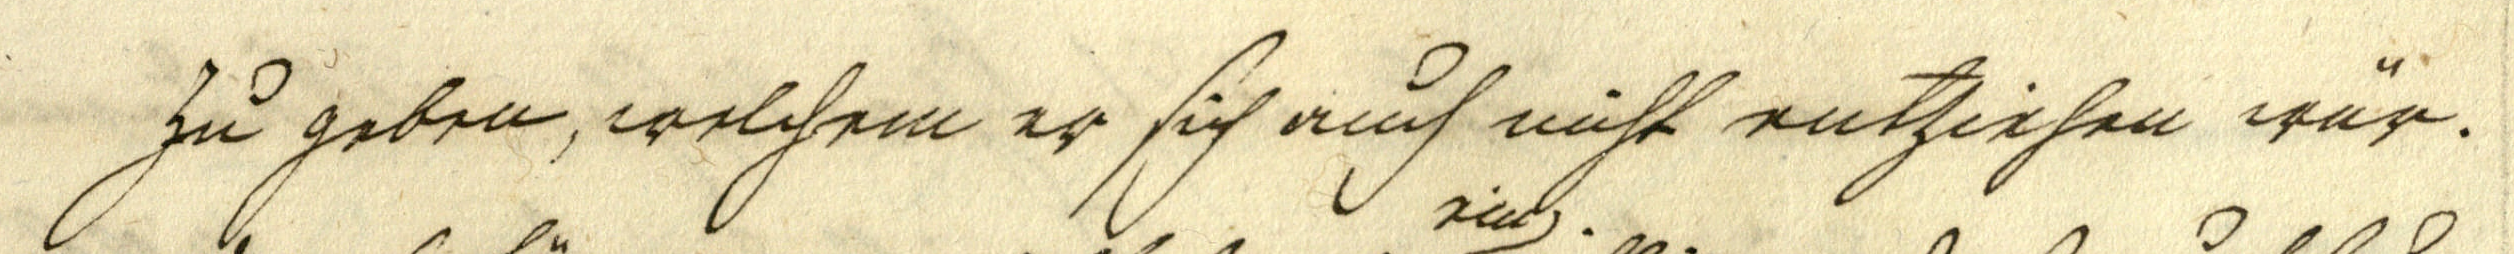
zu geben, welchem er sich auch nicht entziehen wür-
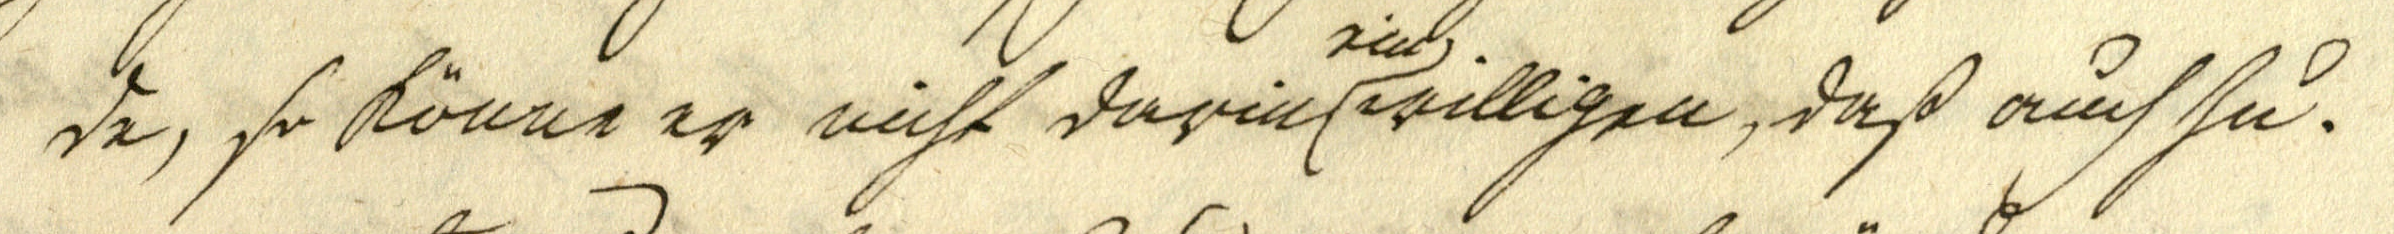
de, so könne er nicht darin willigen, daß auch zu-
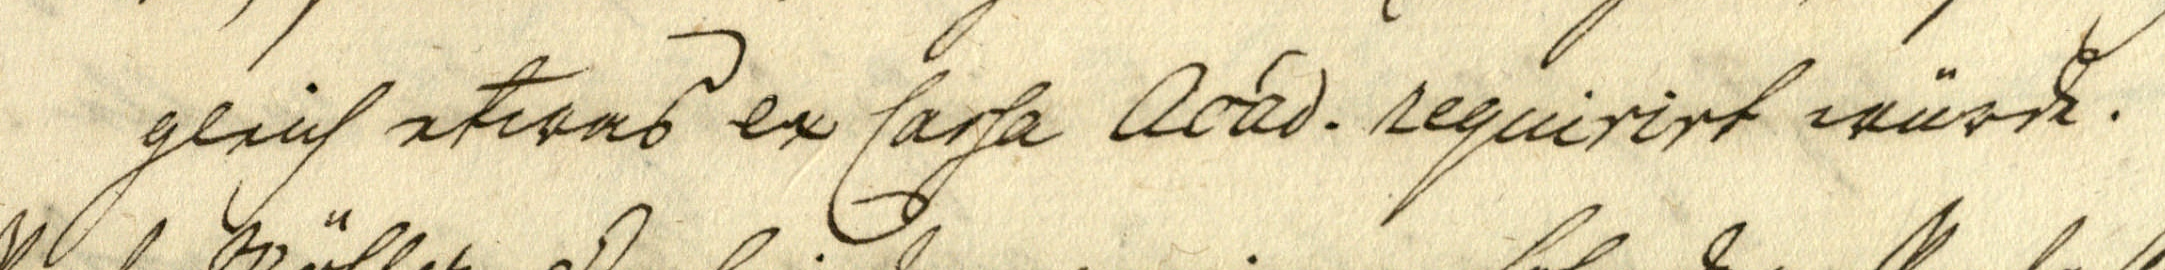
gleich etwas ex Cassa Acad. requirirt würde.
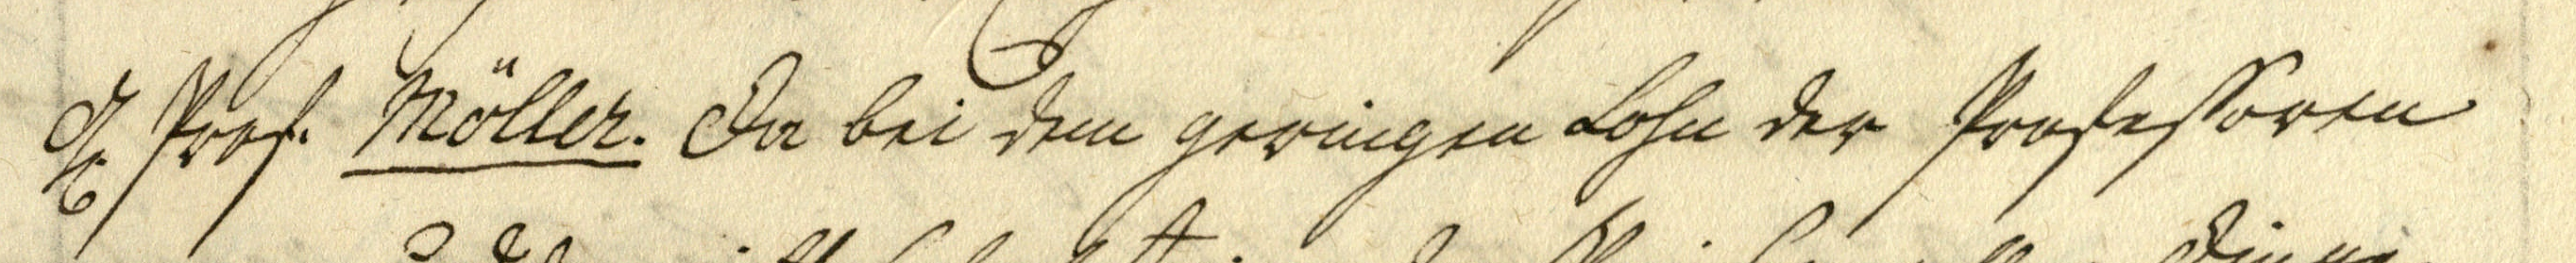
dh. Prof. Möller. Da bei dem geringen Lohn der Professoren
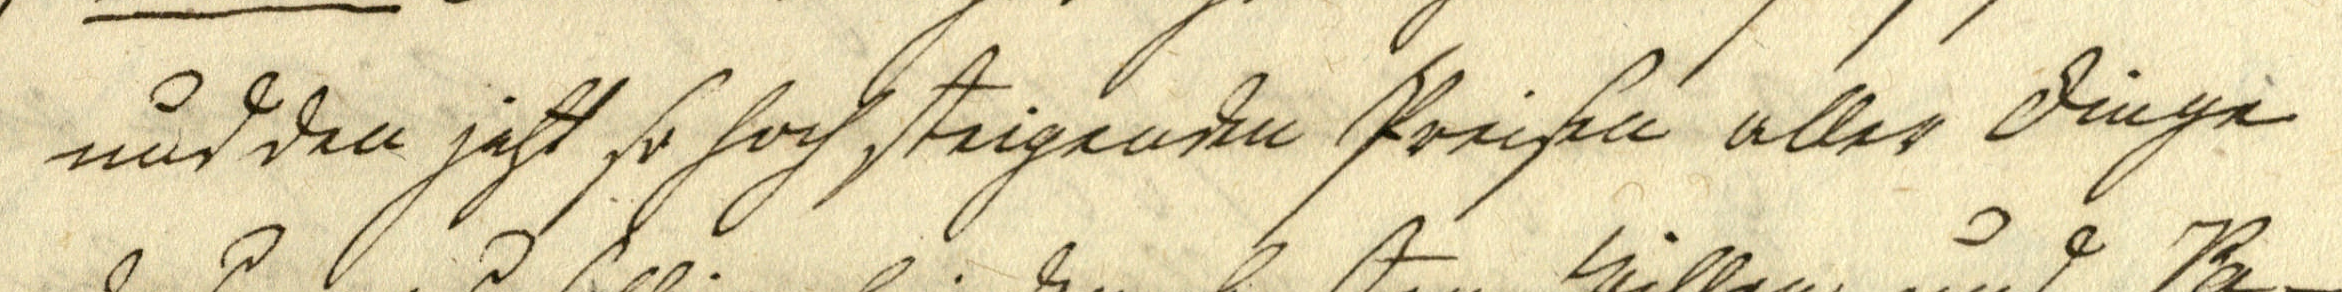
und den jetzt so hoch steigenden Preisen aller Dinge
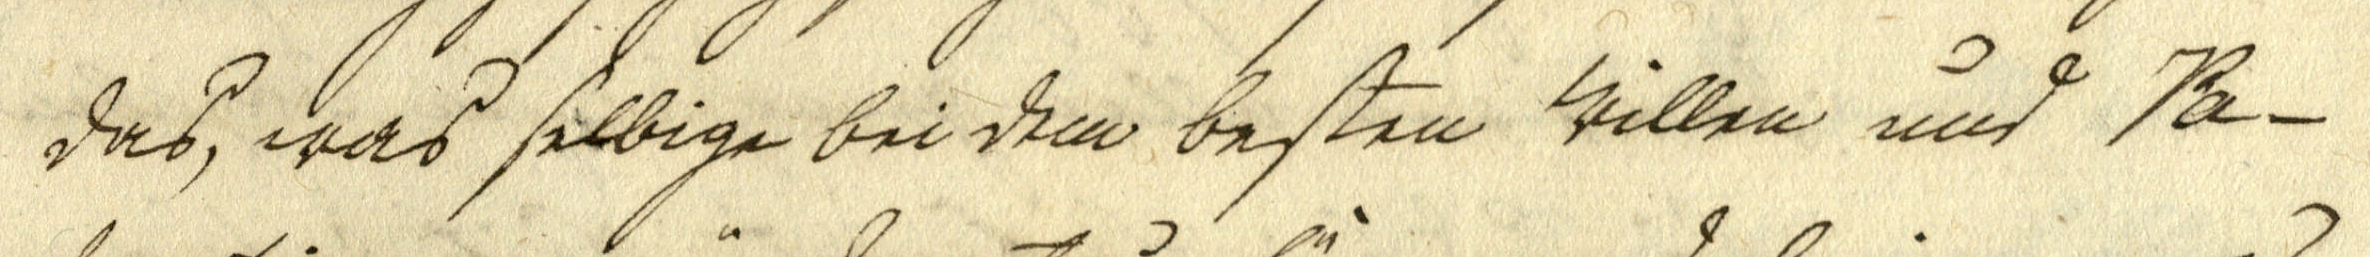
das, was selbige bei dem besten Willen und Pa-
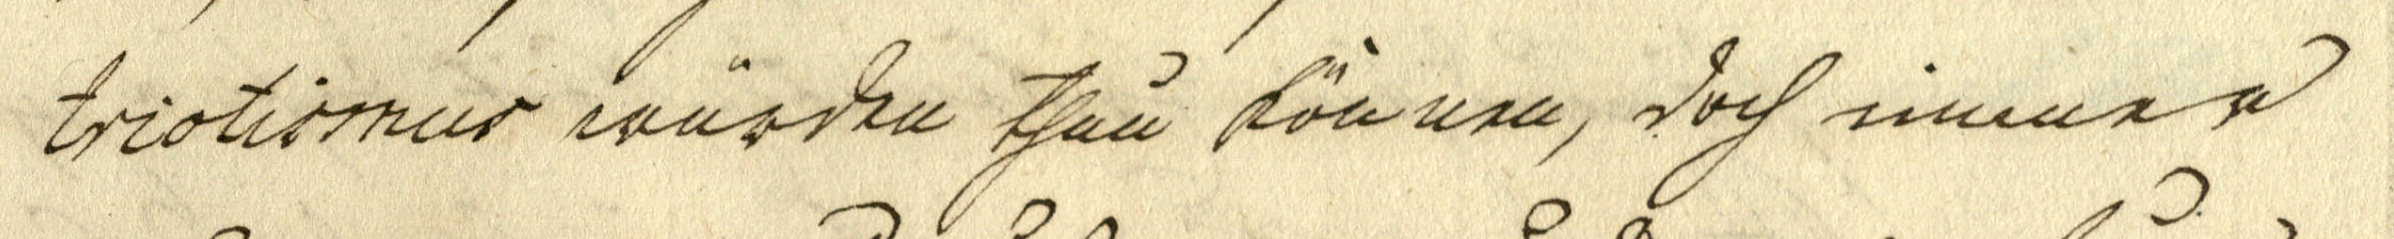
triotismus würden thun können, doch immer
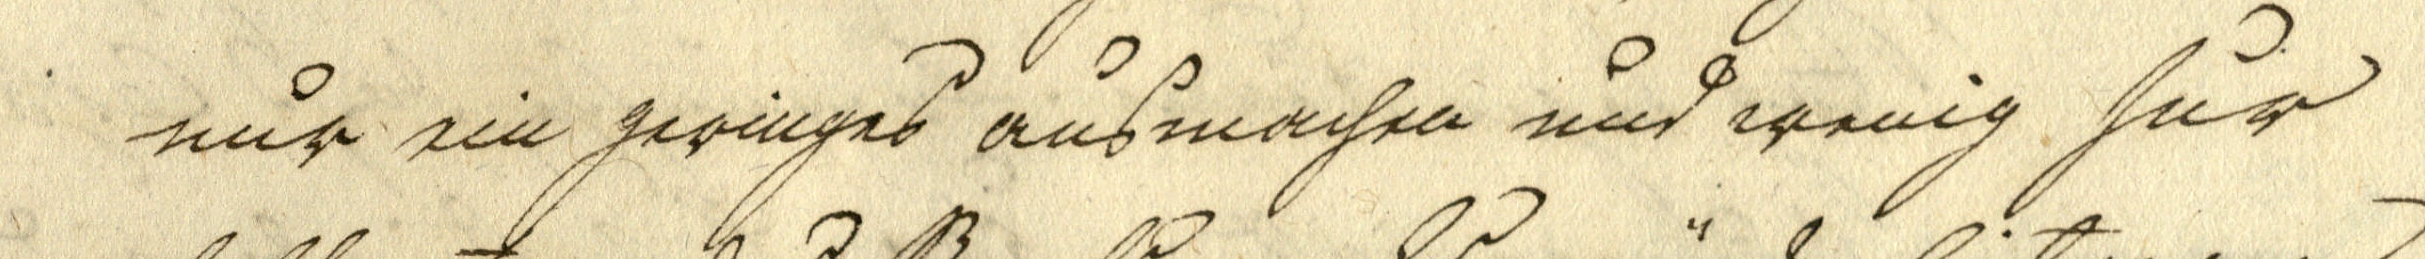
nur ein geringes ausmachen und wenig zur
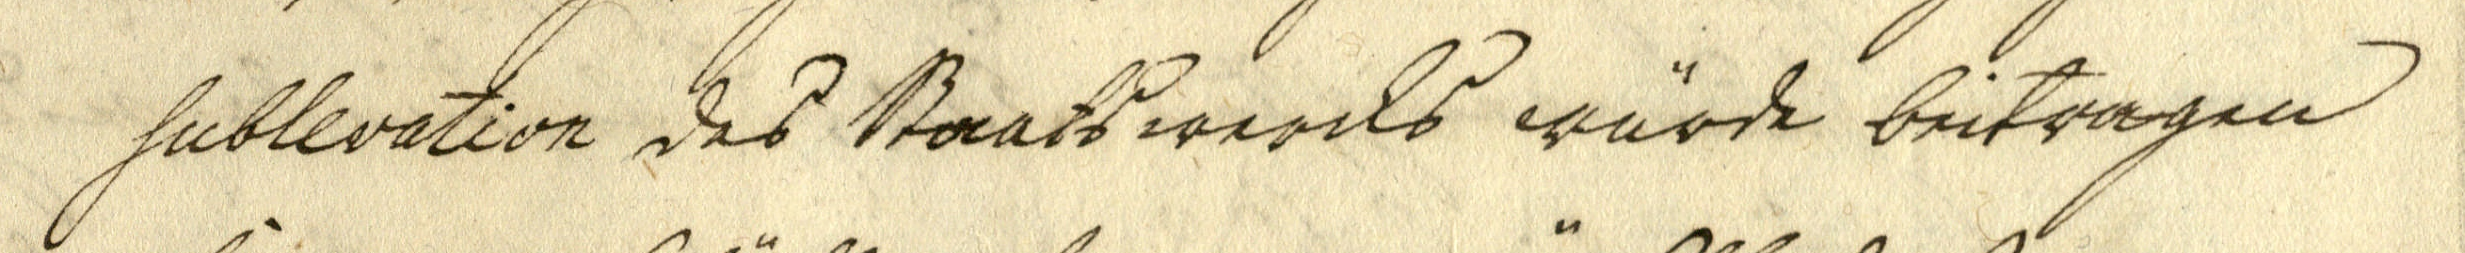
sublevation des Staatswerks würde beitragen
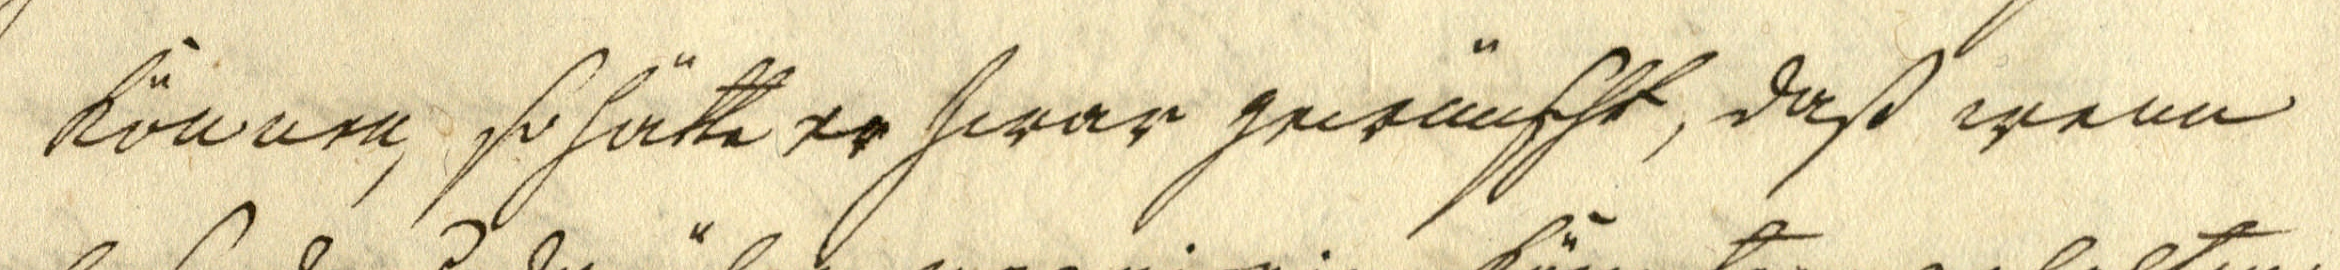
können, so hätte er zwar gewünscht, daß wenn
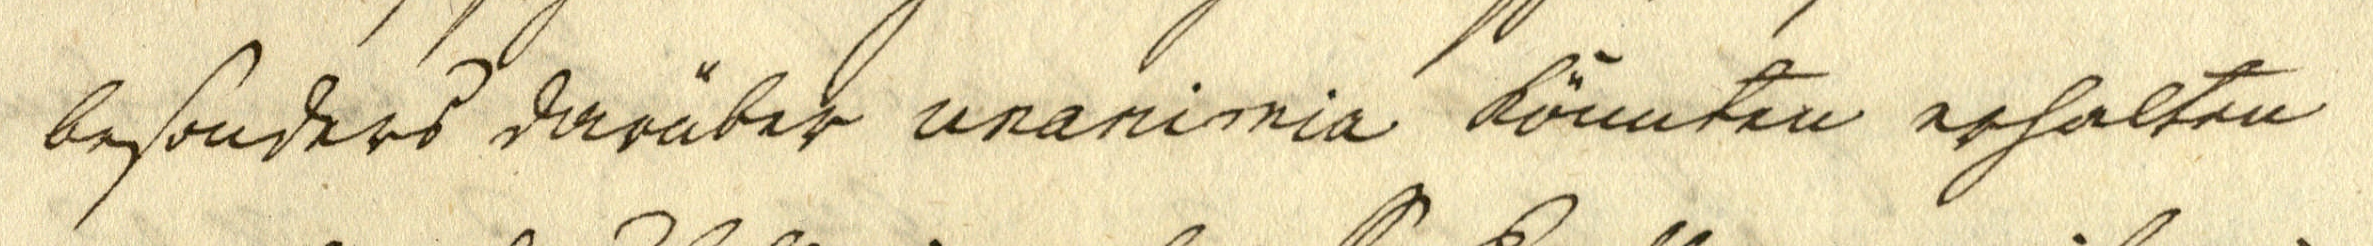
besonders darüber unanimia könnten erhalten
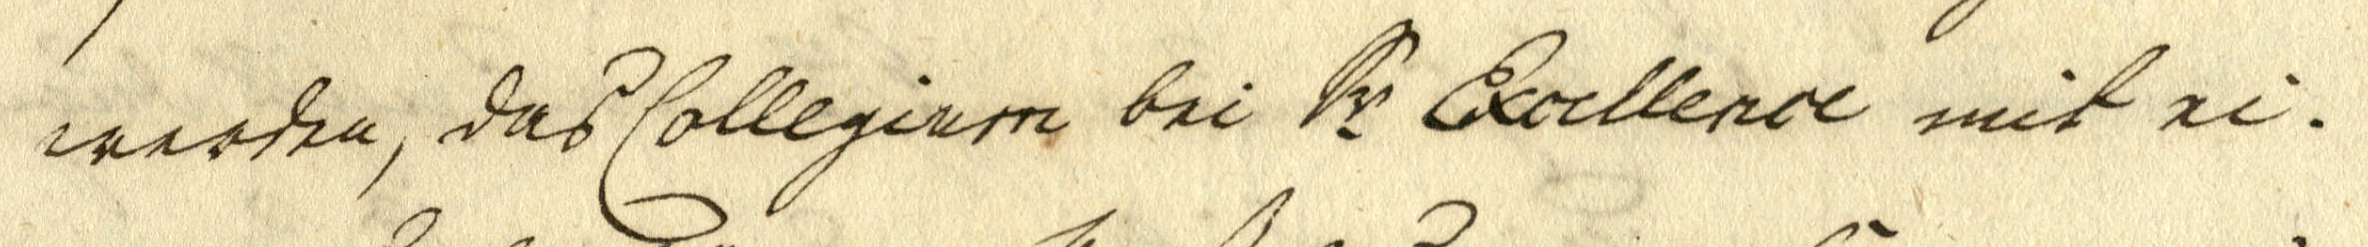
werden, das Collegium bei Sr. Excellence mit ei-
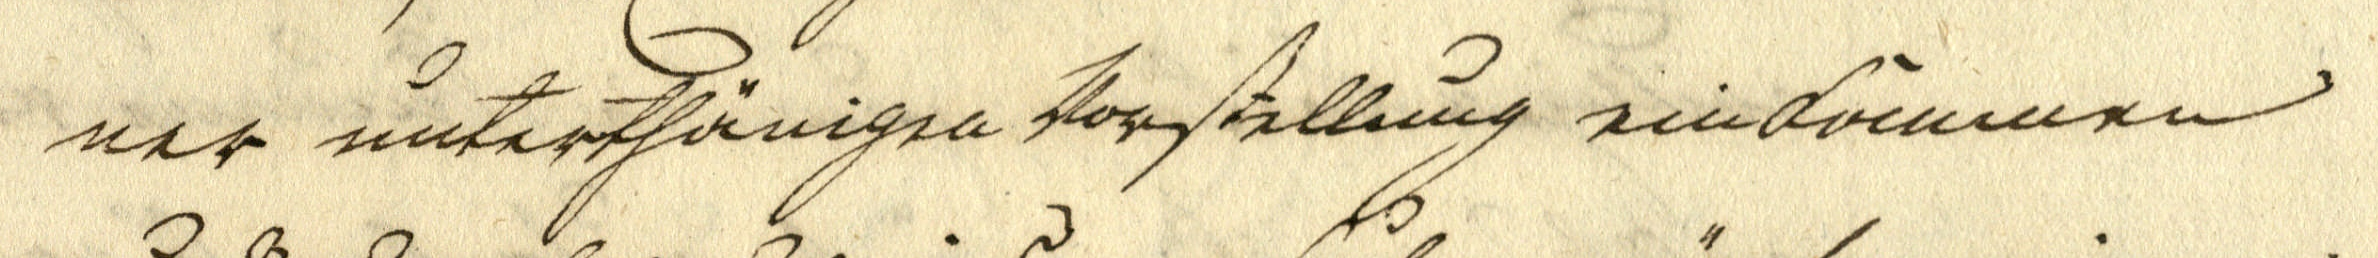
ner unterthänigen Vorstellung einkommen
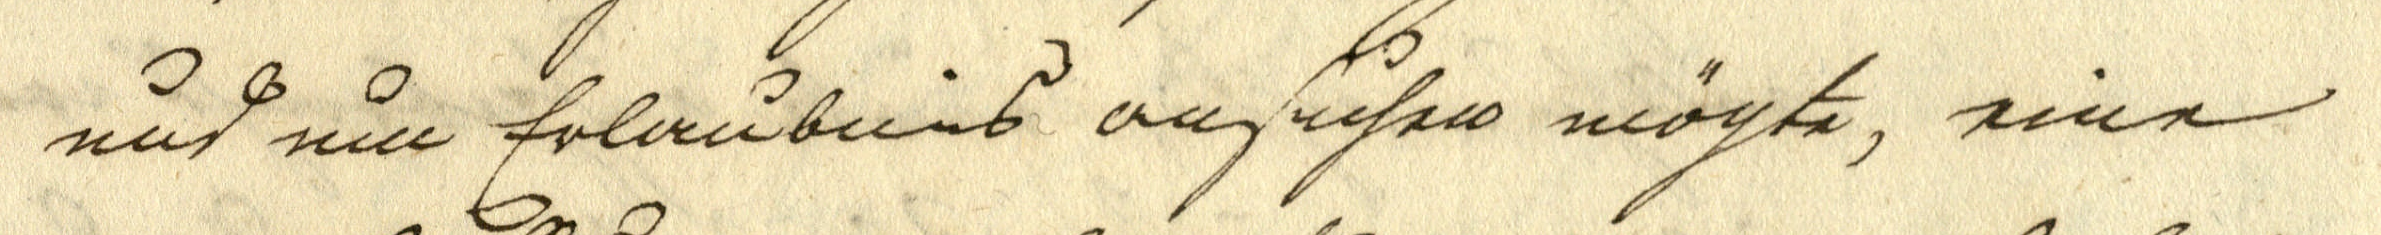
und um Erlaubnis ansuchen mögte, eine
